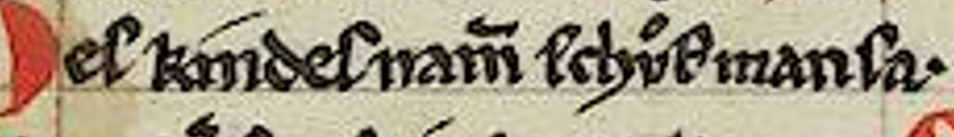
*Deſ kindeſ nam(n) ſchv°of man ſa.
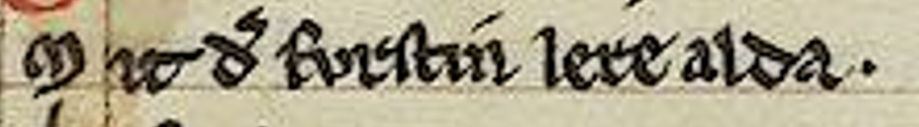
Mit d(er) fvrſtin lere alda.
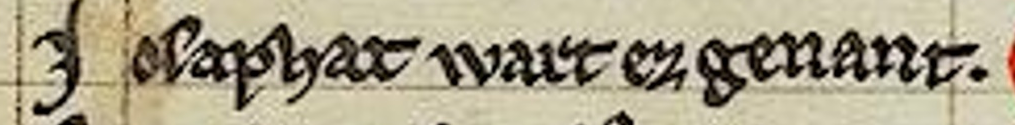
Joſaphat wart ez genant.
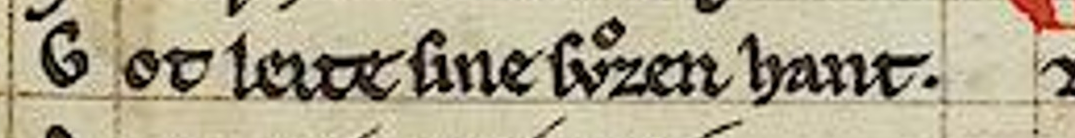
Got leite ſine ſv°ozen hant.
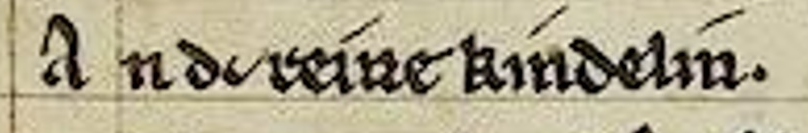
An d(az) reine kindelin.
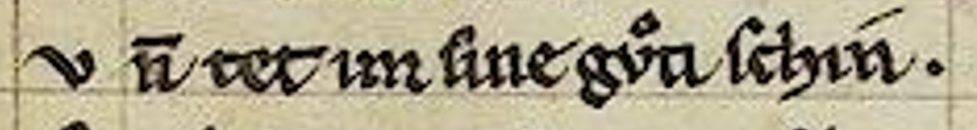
Vn(d) tet im ſine gv°oti ſchin.
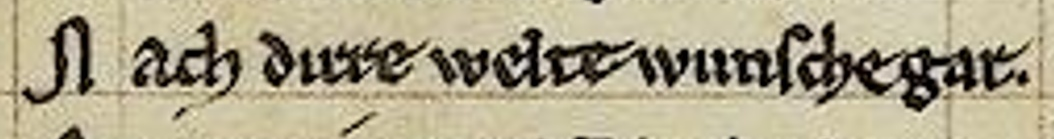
Nach dirre welte wunſche gar.
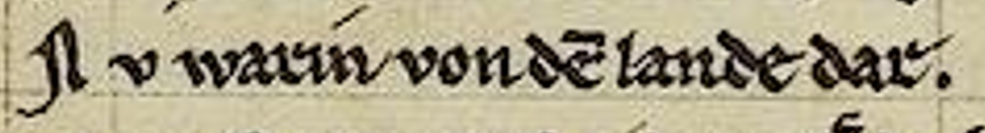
Nv warin von de(m) lande dar.
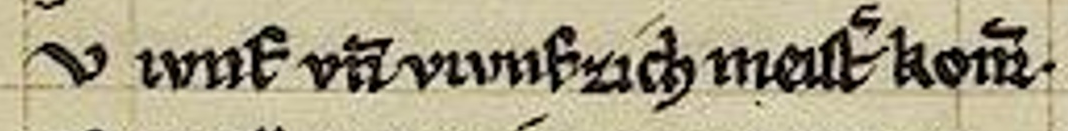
Vivnf vn(d) vivnfzich meiſt(er) kom(n).
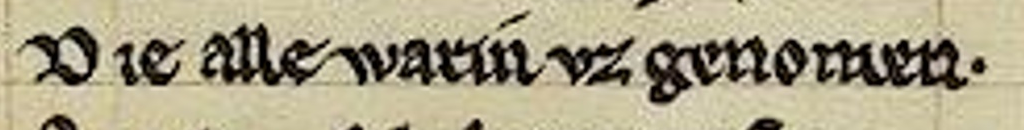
Die alle warein vz genomen.
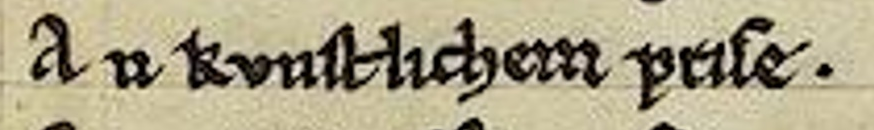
An kvnſtelichem priſe.
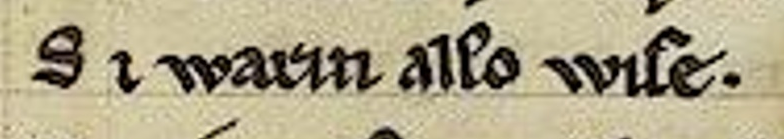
Si warin alſo wiſe.
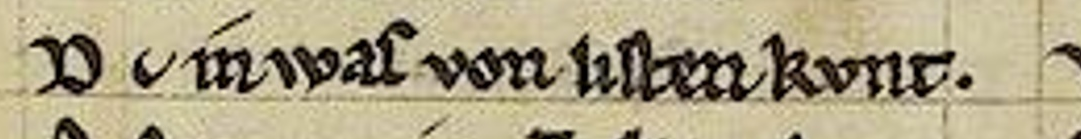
D(az) in waſ von liſten kvnt.
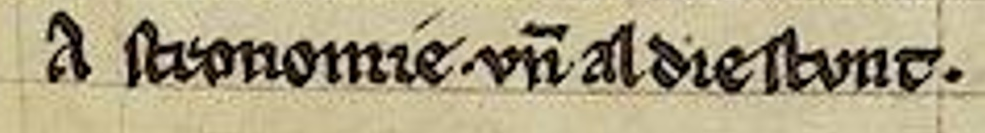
Aſtronomie. vn(d) al die ſtvnt.
